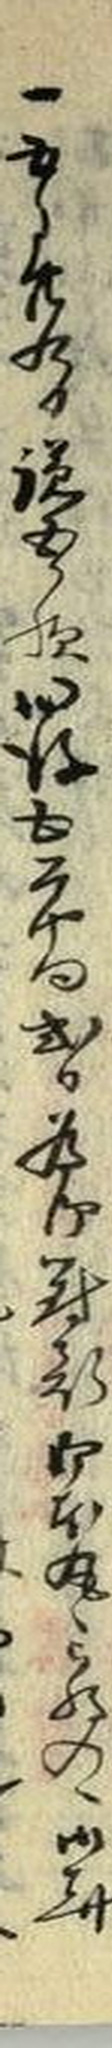一五月廿九日謙五郎様以後五節句式日為御対顔御本丸へ被為入候御刻
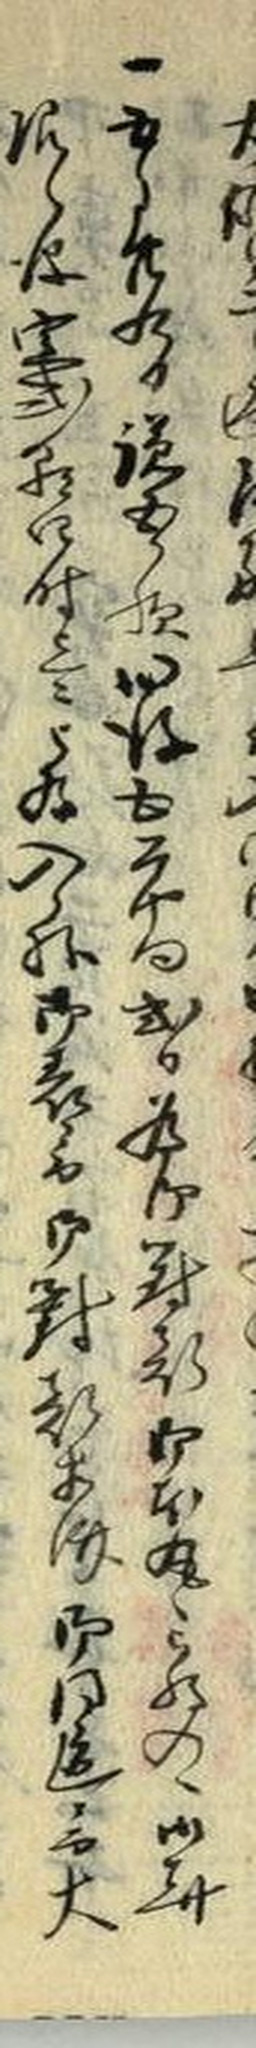限之儀定式朝四時過ニ被為入候様御表ニ而御対顔相済御同道ニ而大
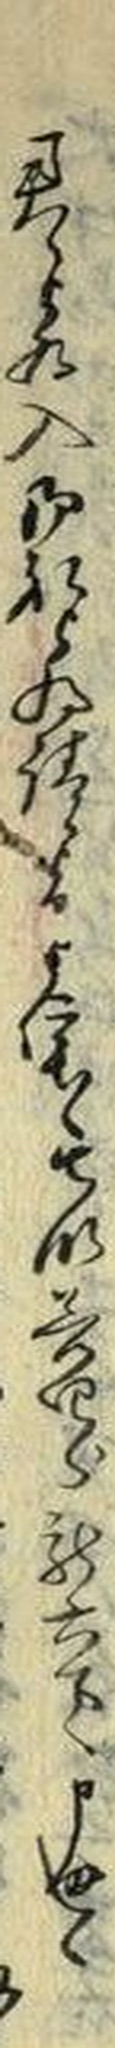奥へ被為入御礼被為請候旨被仰出候其段善四郎新六方へ申通候
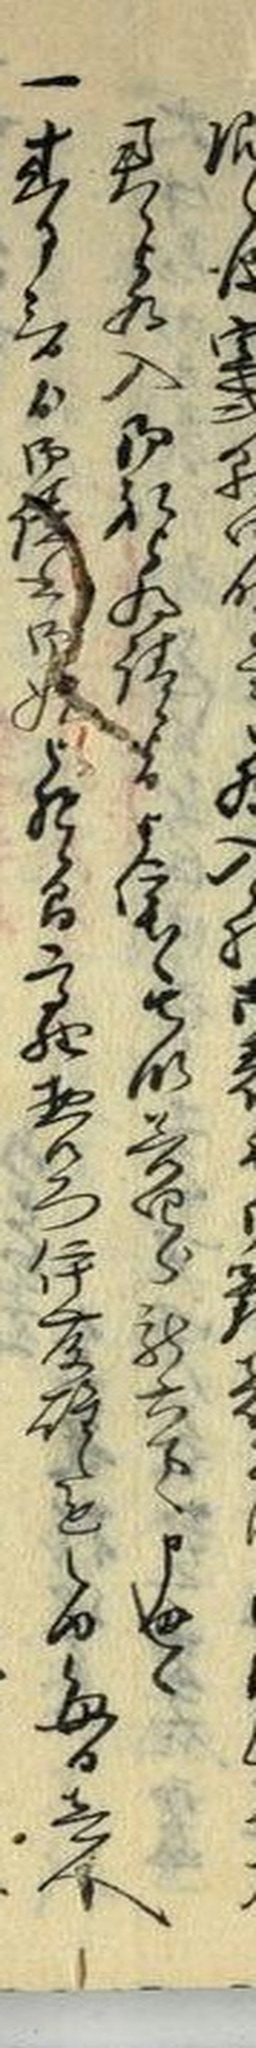一来月三日ゟ御読書御始被遊候間高野惣左衛門伊藤雄之進之内毎日壱人
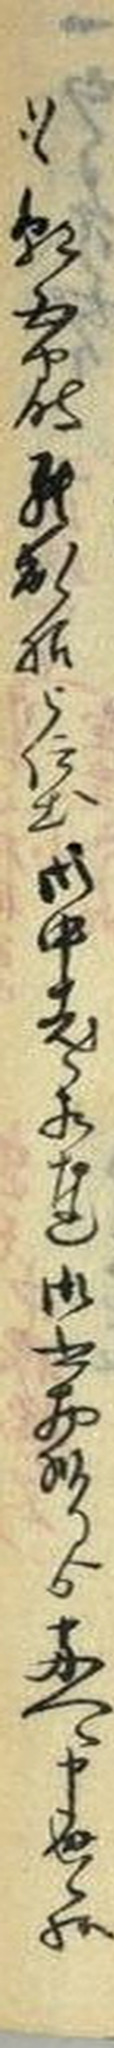ツヽ朝五半時罷出候様被仰出御中老へ相達御書物掛りゟ両人へ申通候様
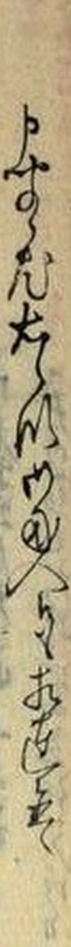申聞候尤右之段御用人江も相達置候
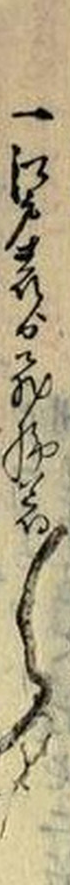一江戸表ゟ飛脚着
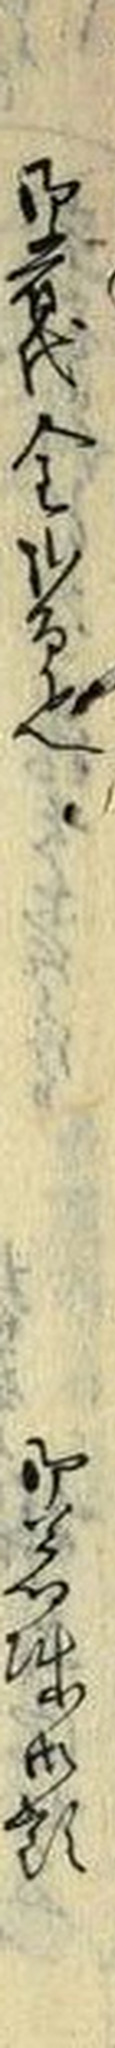御肴代金弐百疋御着城御歓
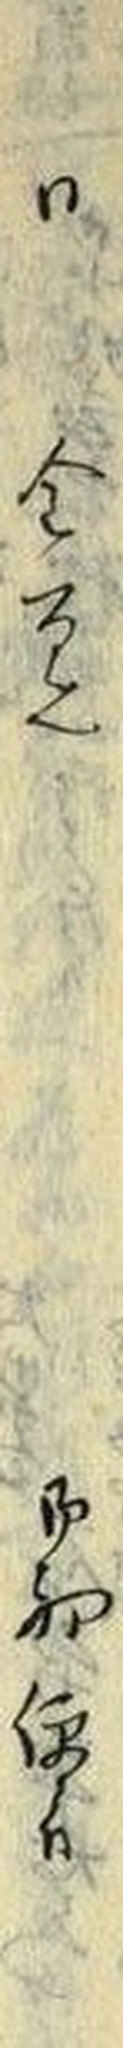同金百疋御初便ニ付
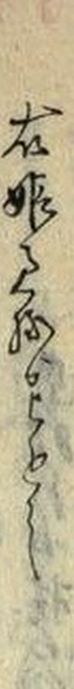右姫君様ゟ被進之
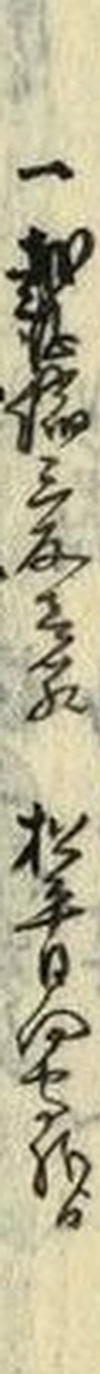一越後縮三反壱箱松平日向守様ゟ
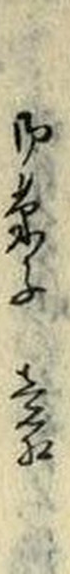御菓子壱箱
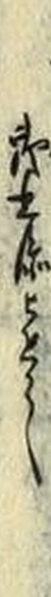御書添被進之
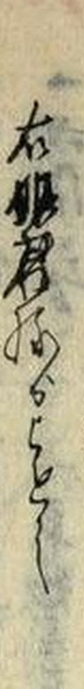右姫君様ゟ被進之
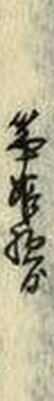箏姫様ゟ
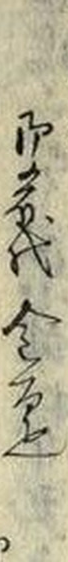御肴代金百疋
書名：少傅日録抄（斉承付側向頭取日記、在国）
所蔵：福井県文書館 Fukui Prefectural Archives
